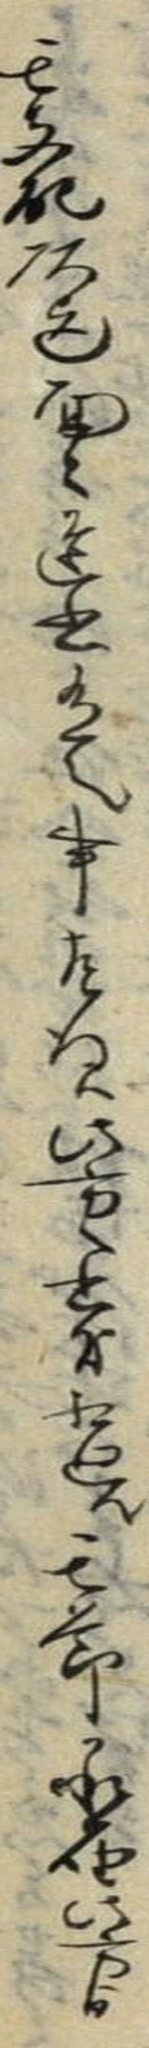其支配頭迄面々達書有之事左候得は此方へ書付相廻る其節承届此方ゟ
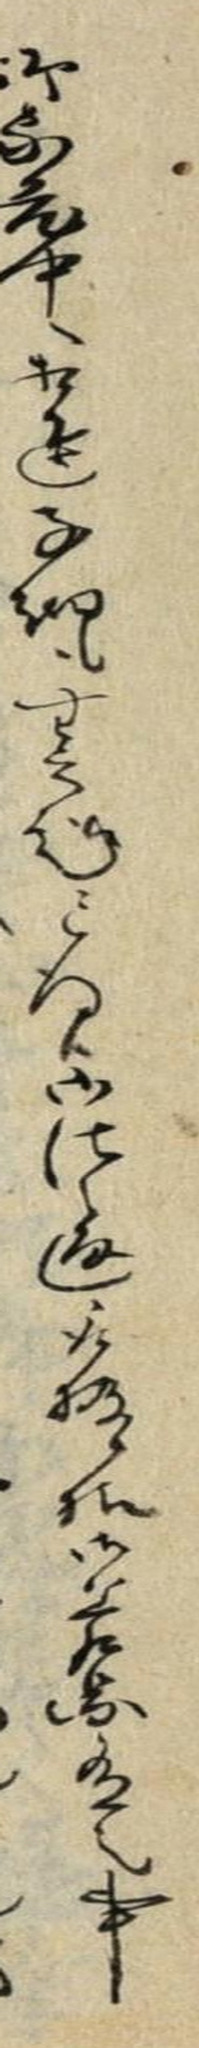御家老中へ相達子細も無之趣に候得は御法之通取扱候様御差図有之事
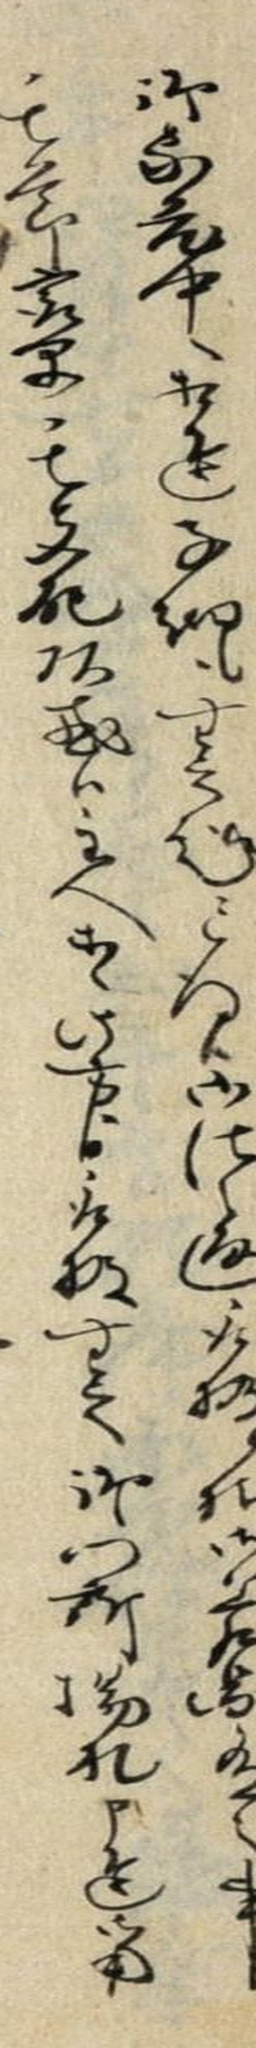其節最早其支配頭或は主人等へ此方ゟ取扱無之御門所揚札申達御用
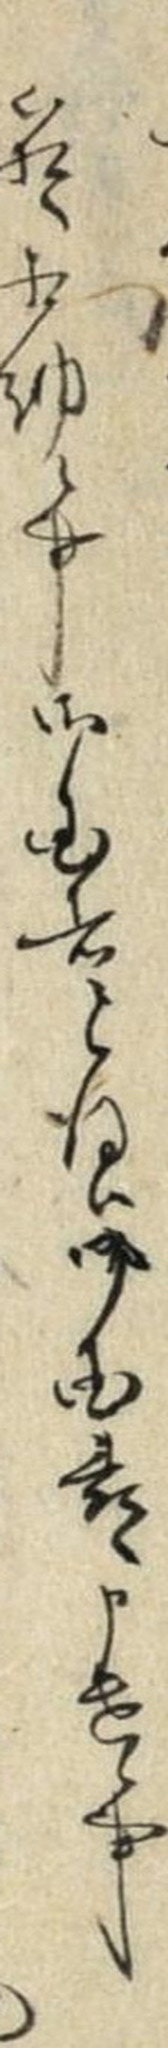箱へ相納候事御国者に候得は御国表へ申遣候事
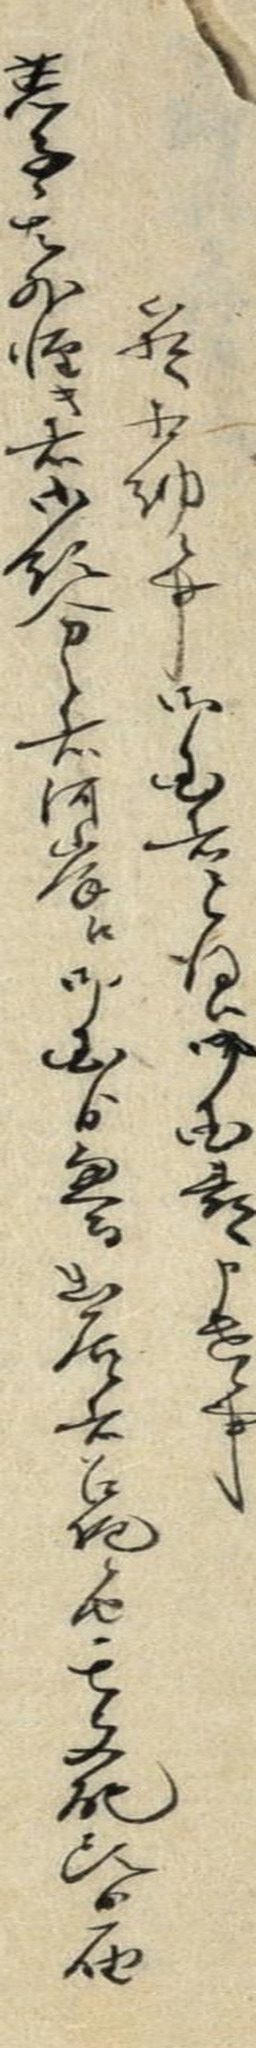一荒子其外軽き者御領分之者河岸江御国ゟ兼て出居候者召抱候由其支配頭ゟ届
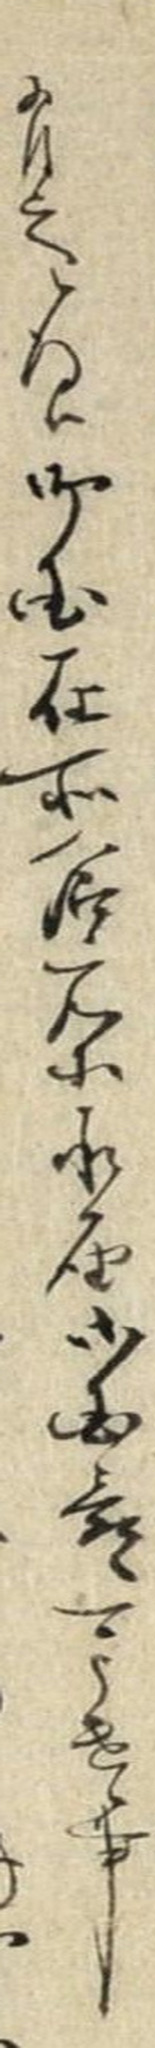有之候得は御国在所名元等承届御国表へ可申遣候事
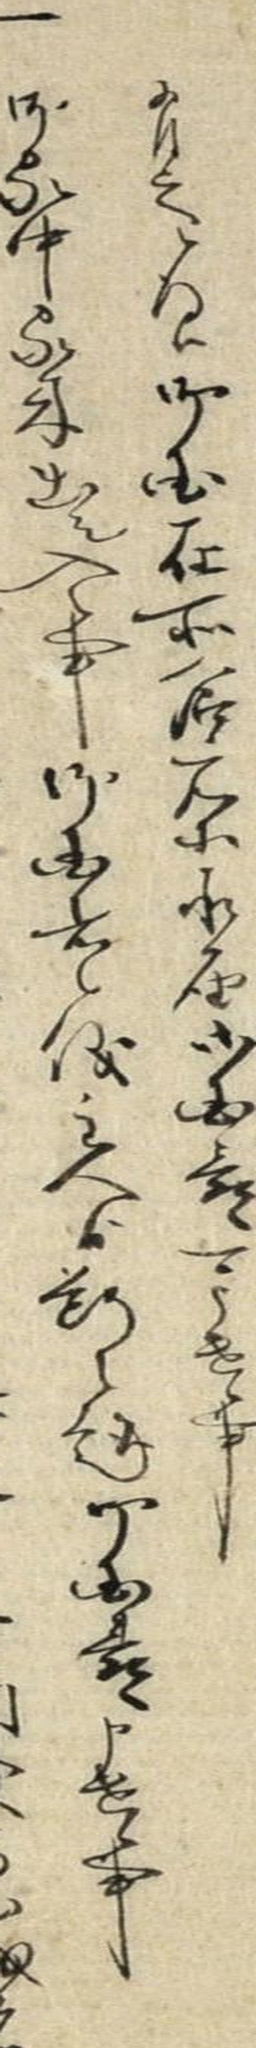一御家中家来出し入之事御国者之儀主人ゟ断候趣御国表へ申遣候事
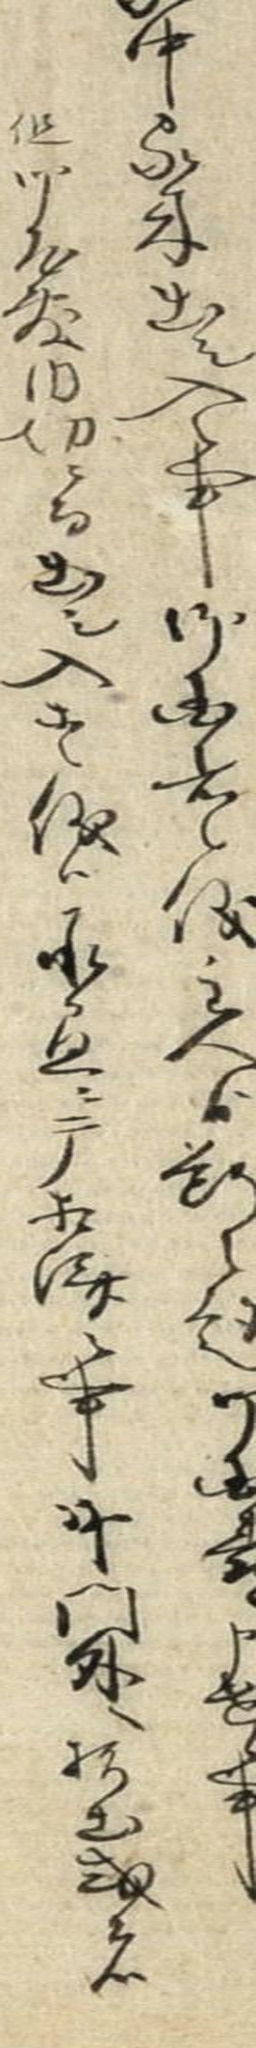但御屋敷内切にて出し入等之儀は承置にて相済候事御門外へ指出或は
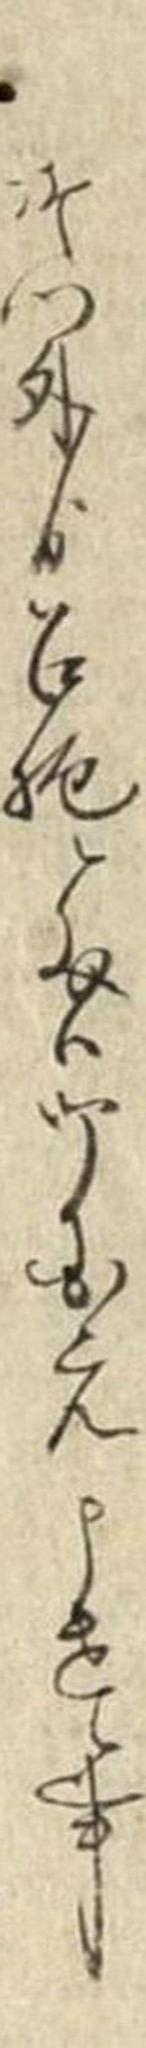御門外ゟ召抱候義は御国元申遣候事
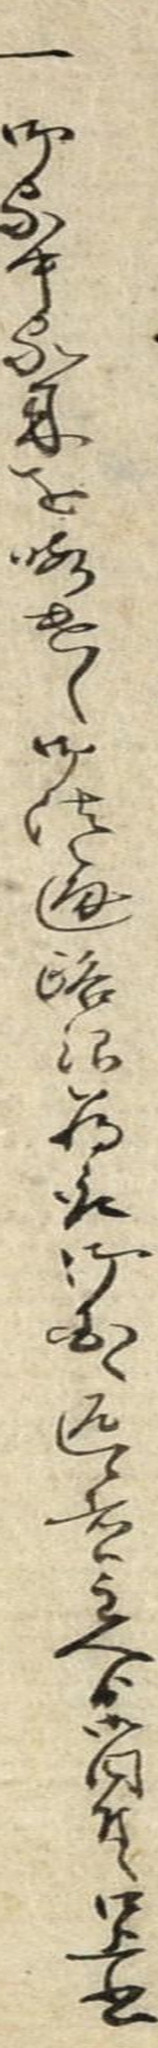一御家中家来を暇遣し御法之通路銀為取御国へ返候者は主人ゟ御目付へ口上書
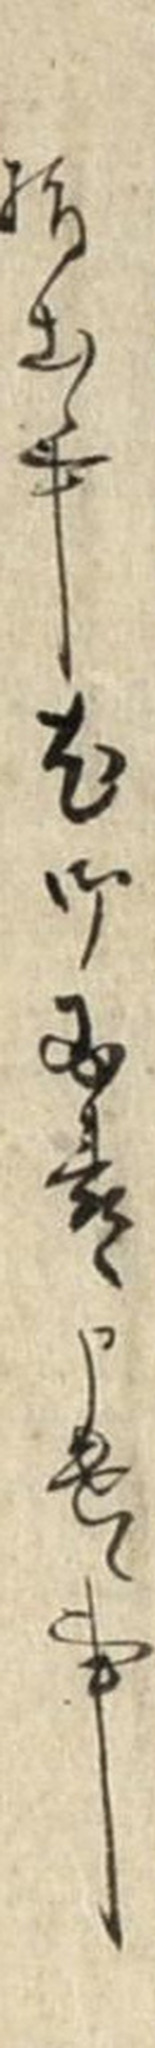指出候事尤御国表へ申遣候事

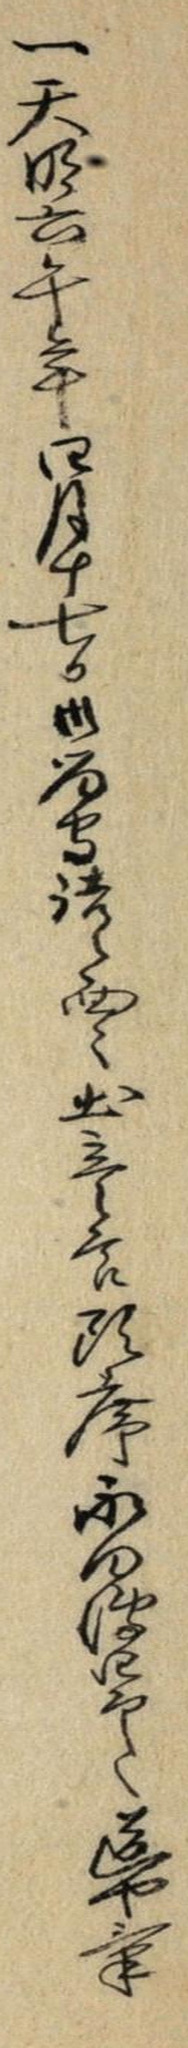一天明六午年四月十七日御留守詰之面々出立之節頭席永田伝四郎へ道中気
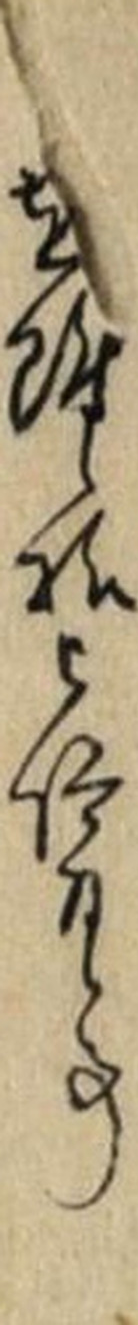を附候様被仰付候事

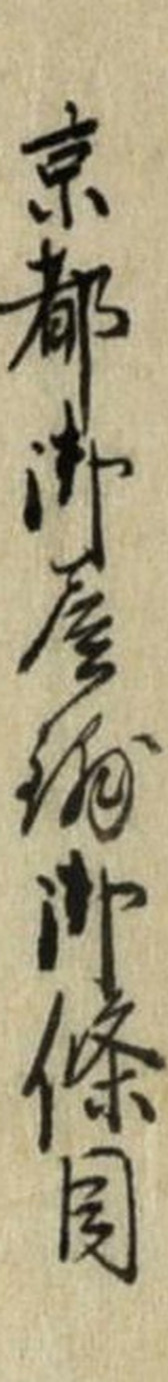京都御屋鋪御条目
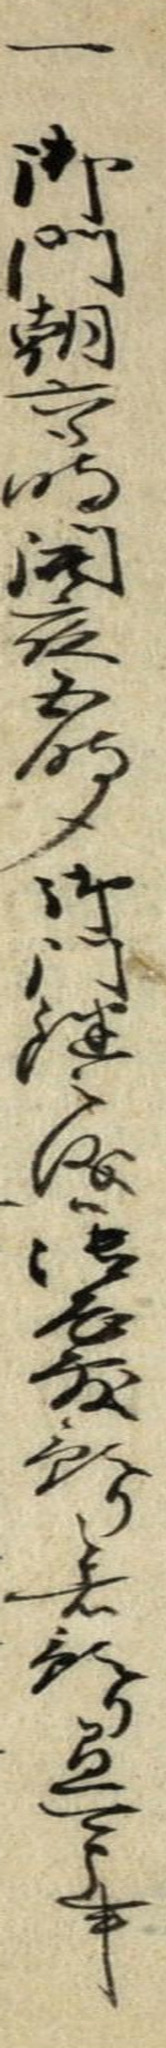一御門朝六ツ時開夜五時〆御門鍵之儀ハ御屋敷預り之者預り置可申事
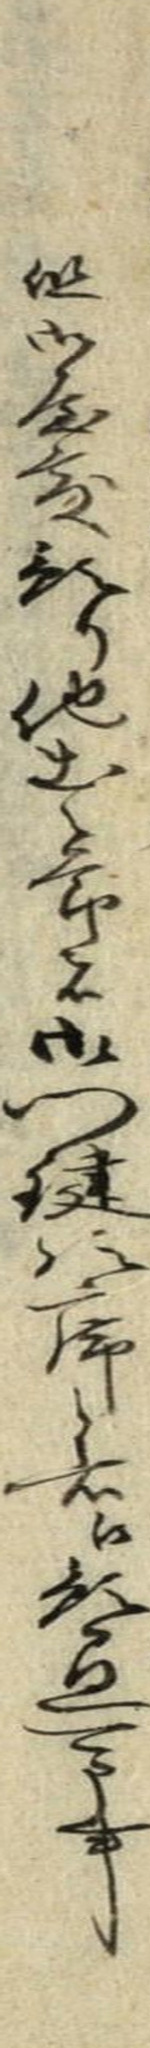但御屋敷預り他出之節者御門鍵御次席之者江預置可申事
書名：三都并道中之部
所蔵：福井県文書館 Fukui Prefectural Archives
